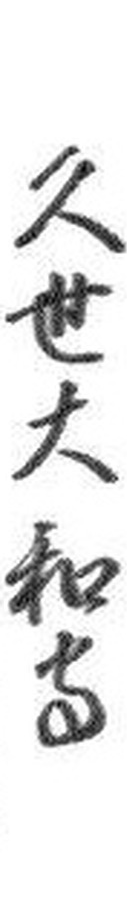久世大和守
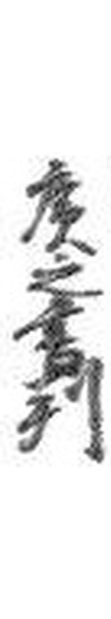広之書判
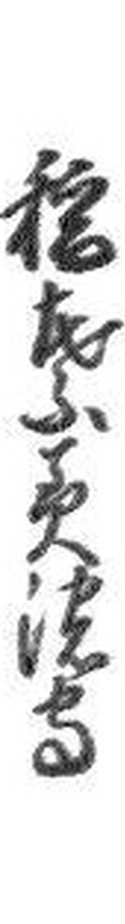稲葉美濃守
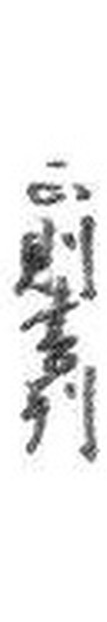正則書判
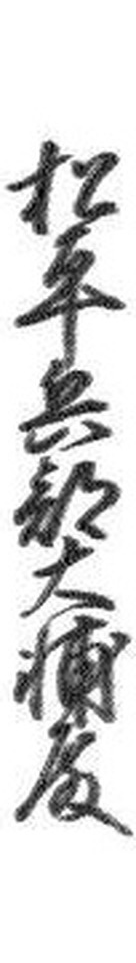松平兵部大輔殿
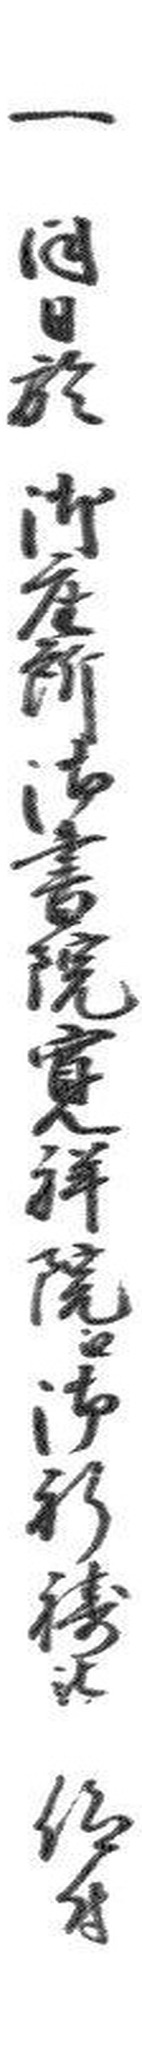一同日於御座所御書院寛祥院江御祈禱被仰付

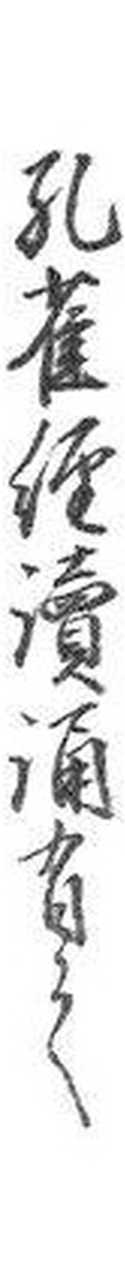孔雀経読誦有之
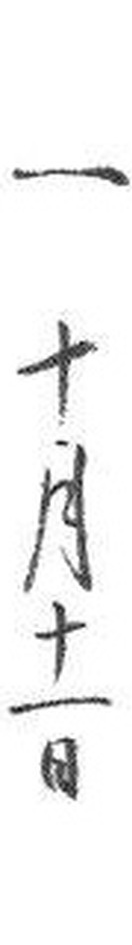一十月十一日
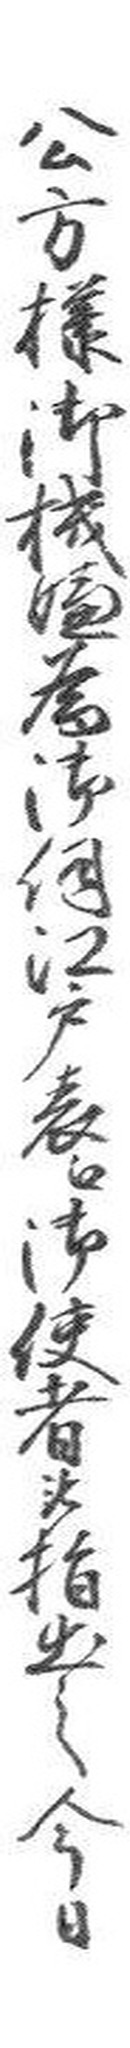公方様御機嫌為御伺江戸表江御使者被指出之今日
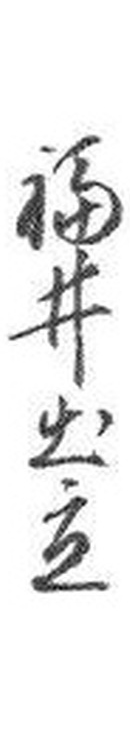福井出立
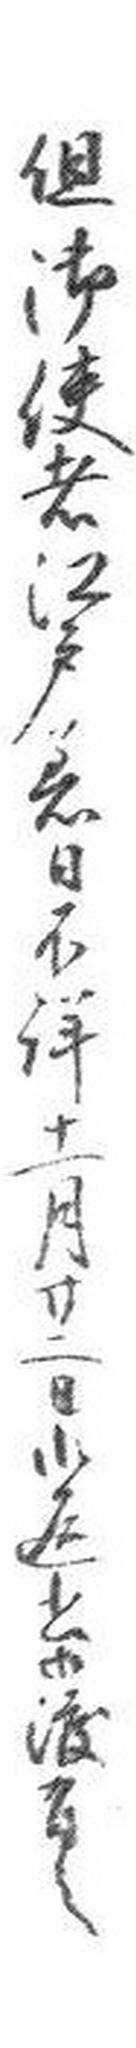但御使者江戸着不詳十一月廿二日御返書御渡有之
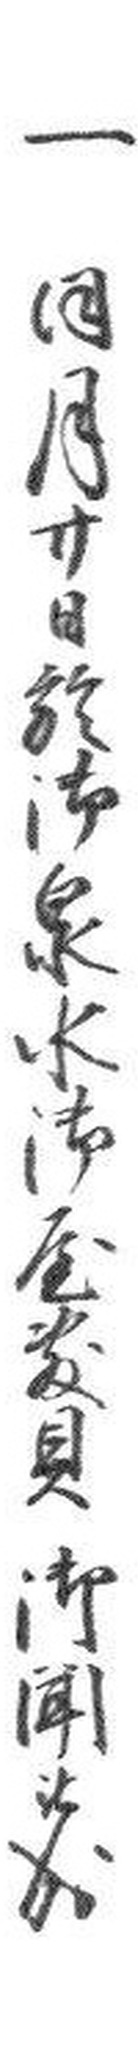一同月廿日於御泉水御屋敷具御聞被成
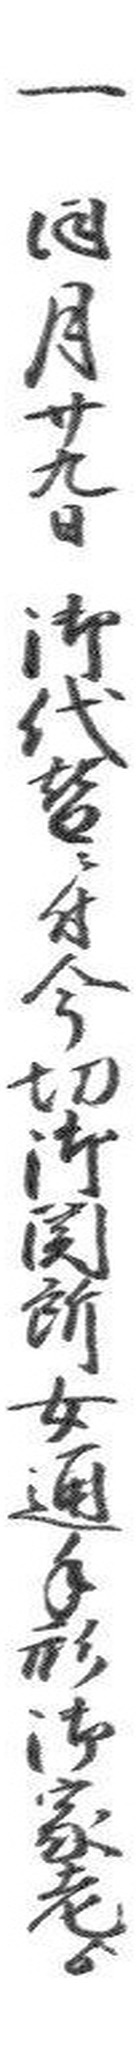一同月廿九日御代替ニ付今切御関所女通手形御家老ゟ
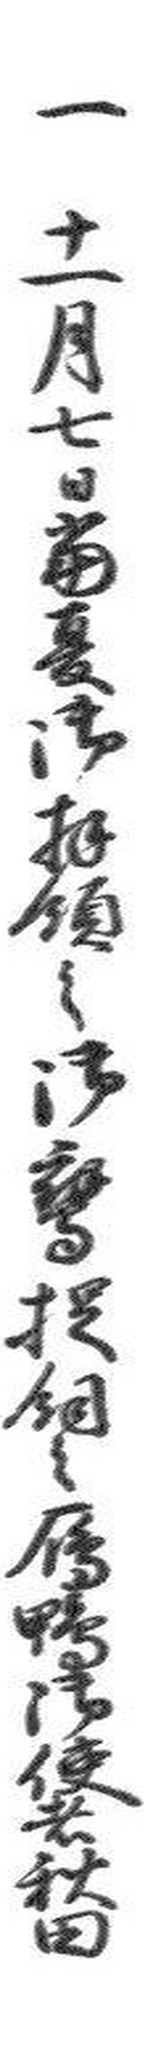一十一月七日当夏御拝領之御鷹捉飼之雁鴨御使者秋田
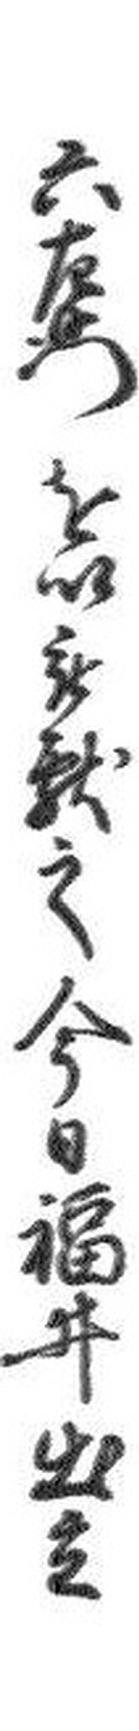六左衛門を以被献之今日福井出立
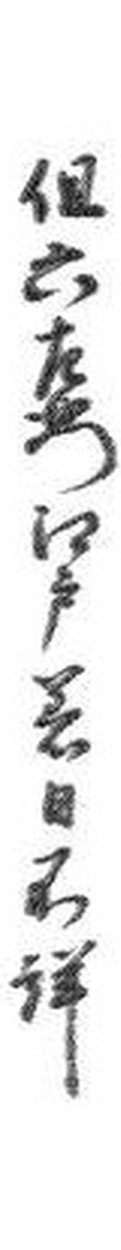但六左衛門江戸着不詳
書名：家譜 十一 昌親公 従延宝二年到延宝四年八月
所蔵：福井県文書館 Fukui Prefectural Archives
